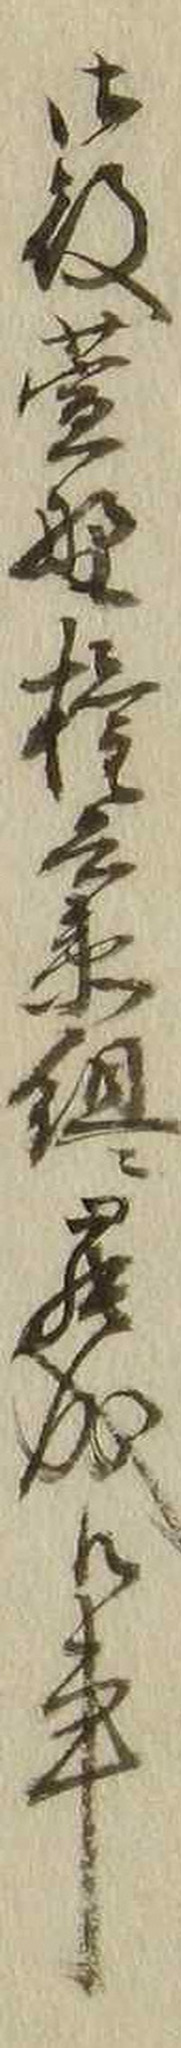御役菅野権兵衛組ニ罷成候事
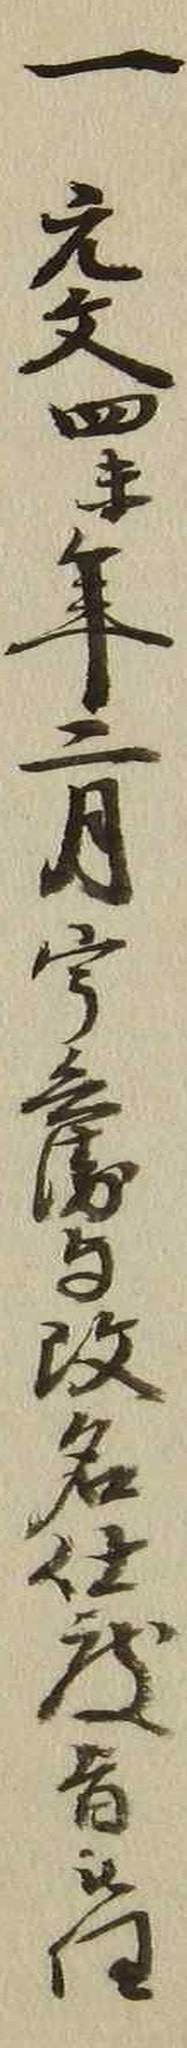一元文四未年二月宇兵衛与改名仕度旨被任
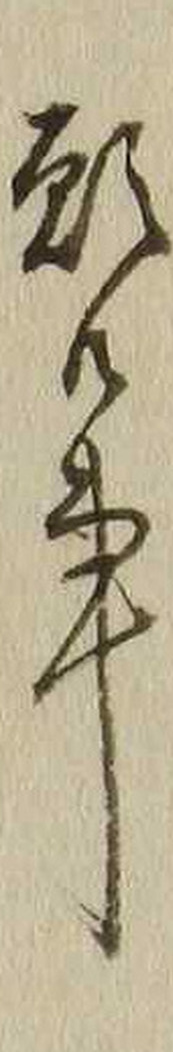願候事
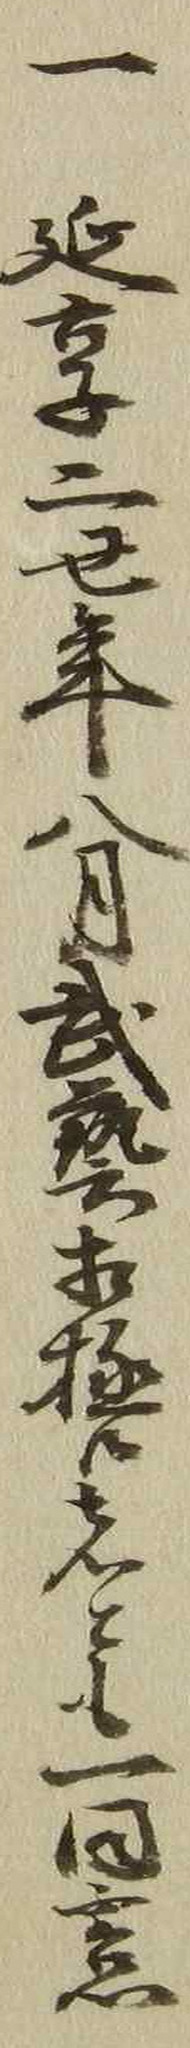一延享ニ丑年八月武芸相極候者とも一同不怠
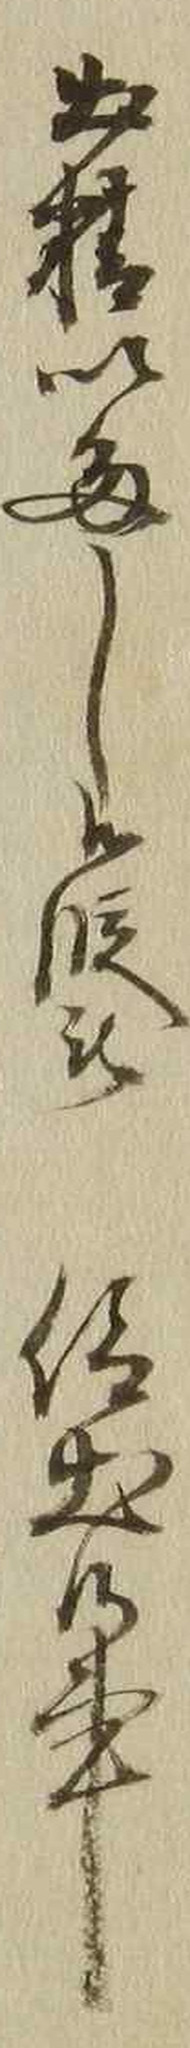出精いたし候段被仰出候事
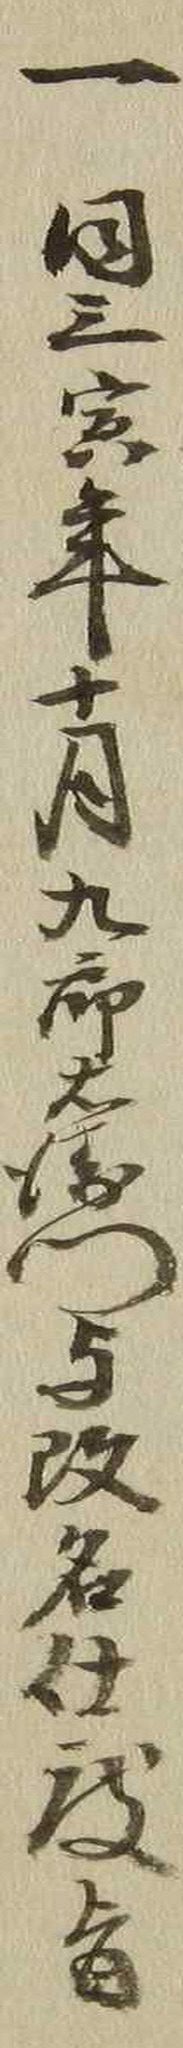一同三寅年十月九郎右衛門与改名仕度旨
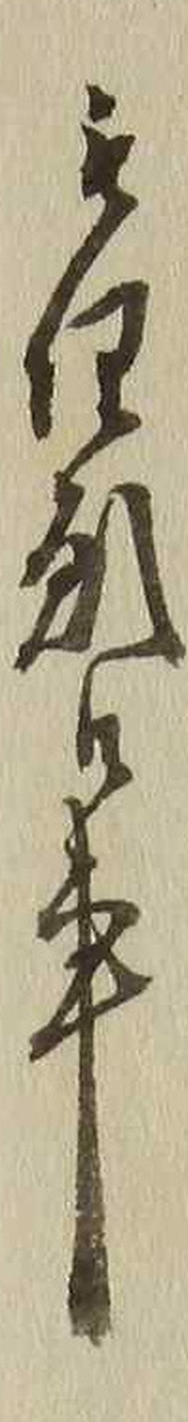被任願候事
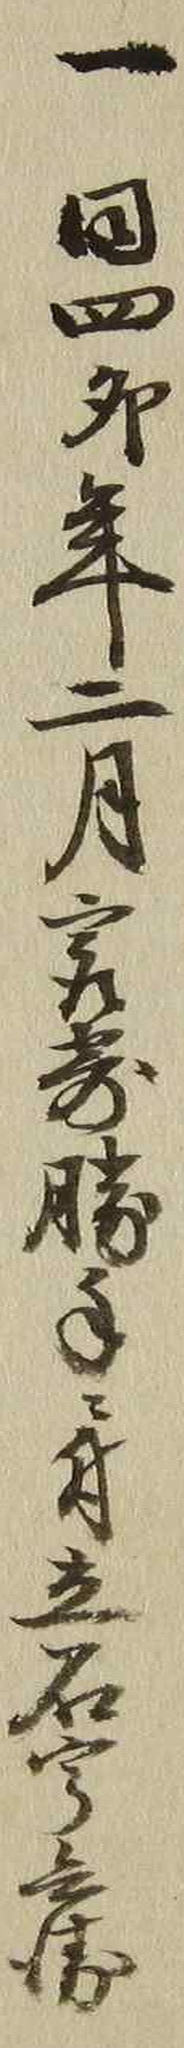一同四卯年二月最寄勝手ニ付立石宇兵衛
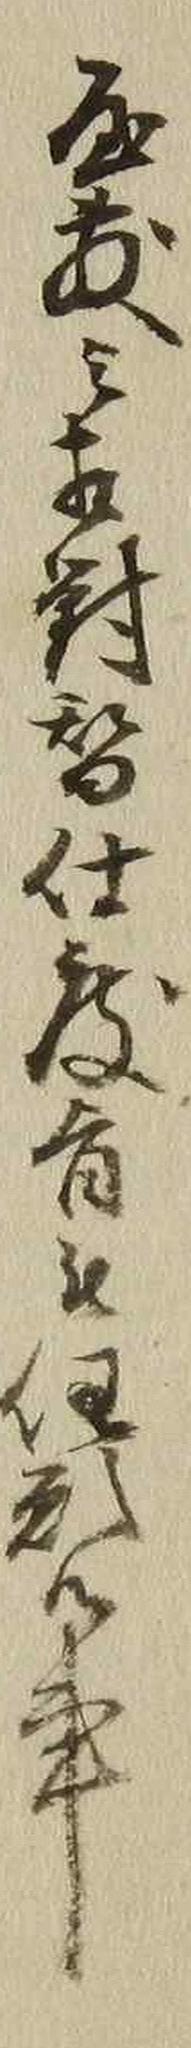屋敷与相対替仕度旨被任願候事
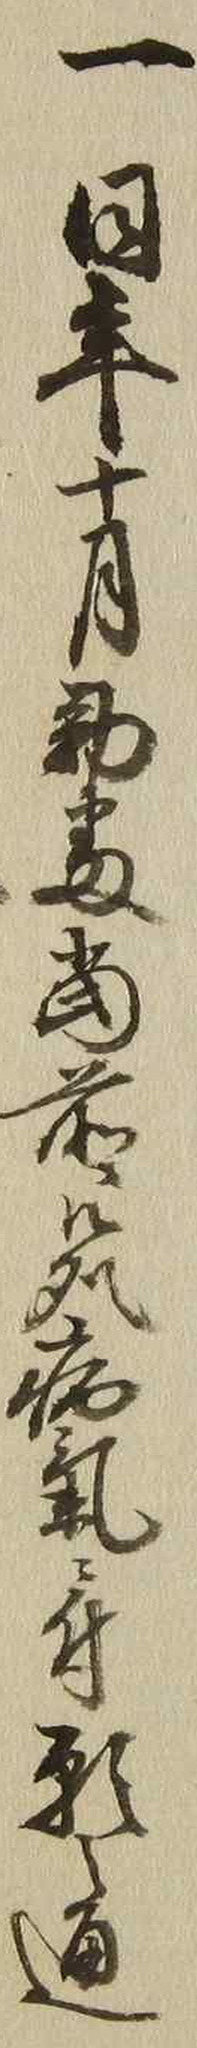一同年十月勤番当然ニ候処病気ニ付願之通
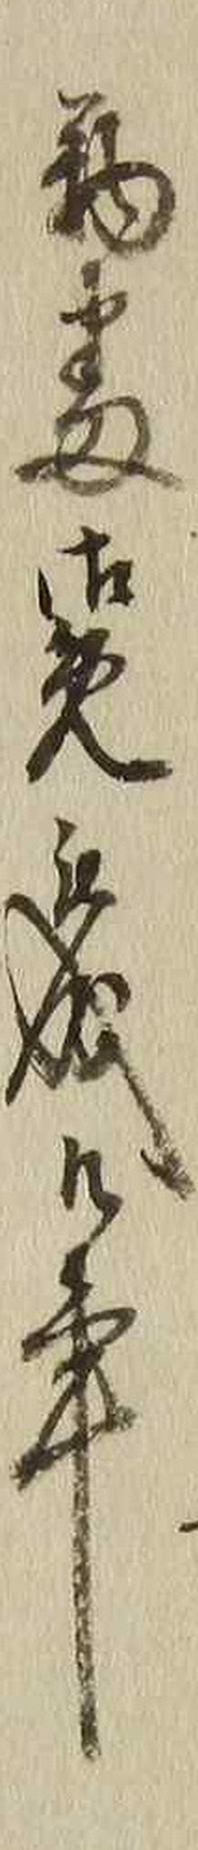勤番御免被成候事
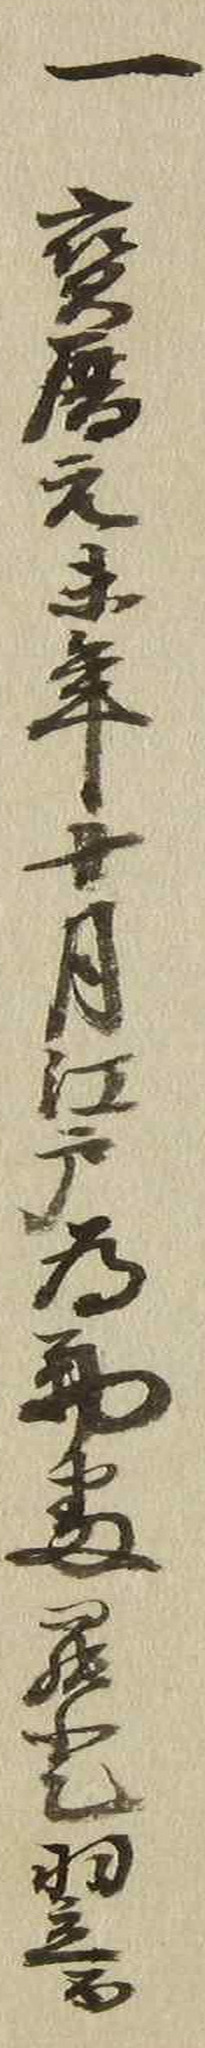一宝暦元未年十月江戸為勤番罷登翌酉
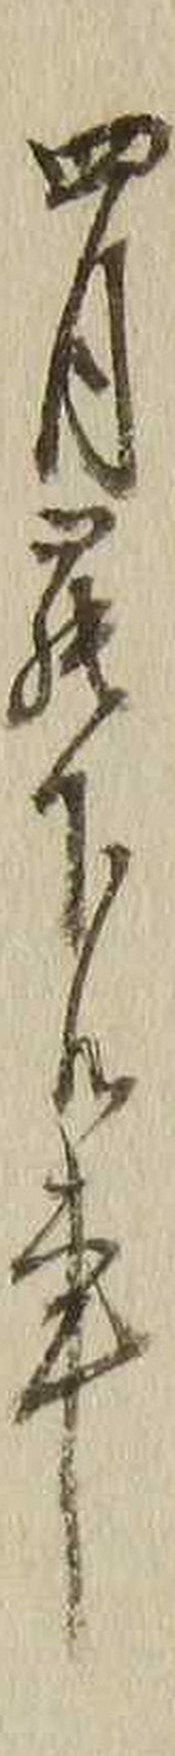四月罷下候事
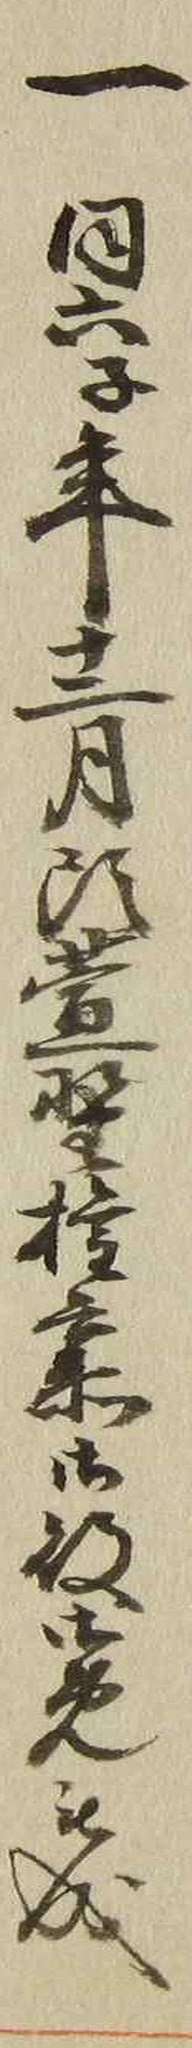一同六子年十二月頭茅野権兵衛御役御免被成
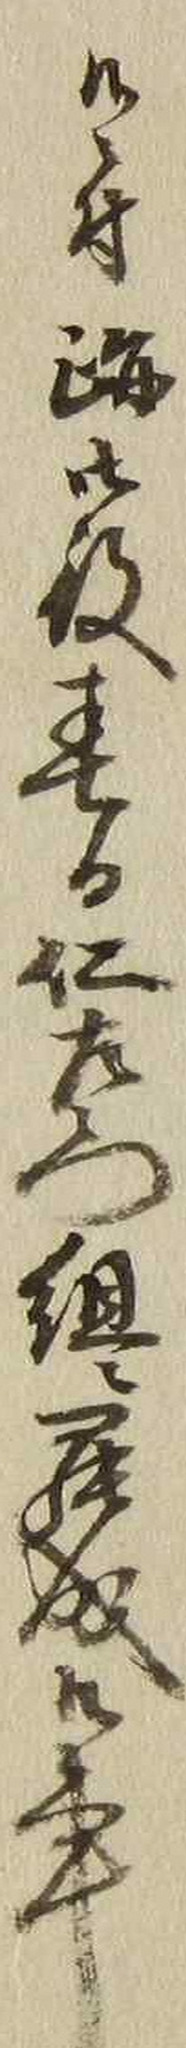候ニ付跡御役春日仁左衛門組ニ罷成候事
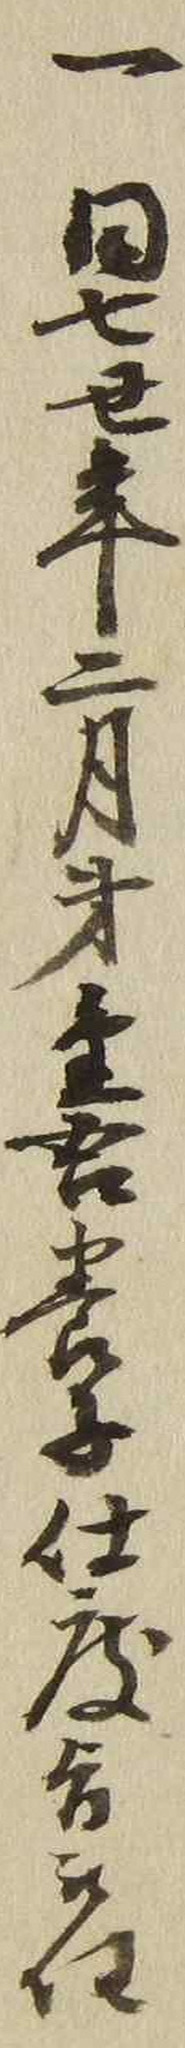一同七丑年二月弟金吾養子仕度旨被任
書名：諸士系譜　巻之64　と之部7
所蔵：会津若松市立会津図書館
